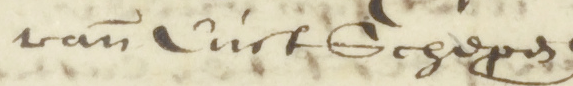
van Cust Schepen
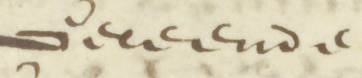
Gereede
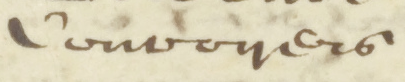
Convoyers
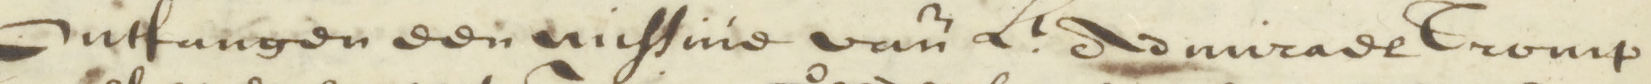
Ontfangen een missive van Lt. Admirael Tromp
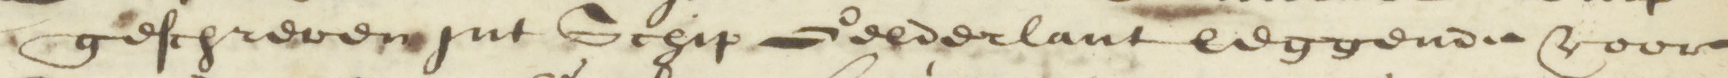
geschreven int Schip Gelderlant leggende voor
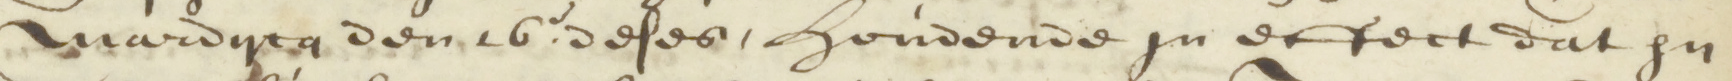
Mardycq den 16e deses, Houdende in effect dat hy
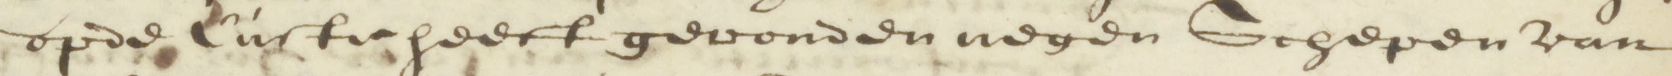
opde Custe heeft gevonden negen Schepen van
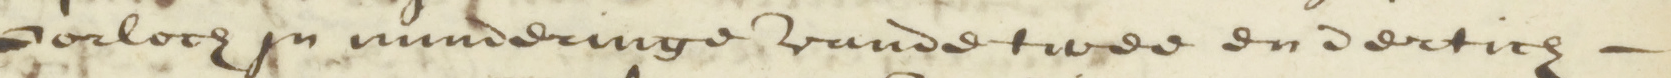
Oorloch in minderinge vande twee en dertich —
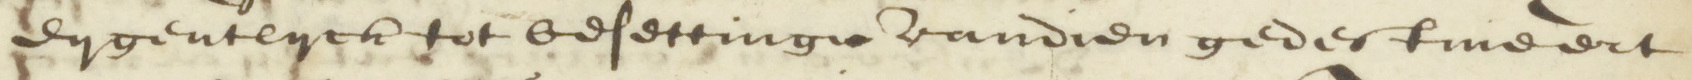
eygentlyck tot besettinge vandien gedestineert
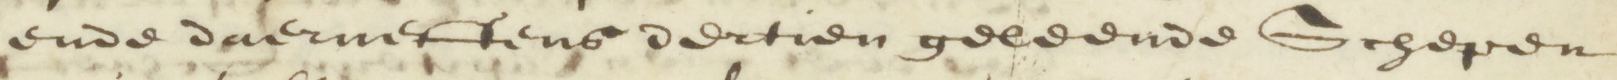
ende daerneffens dertien geleende Schepen
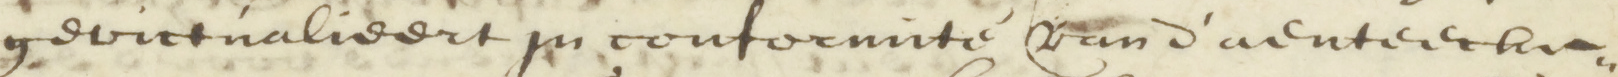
gevictualieert in conformité van d‛aenteecke„
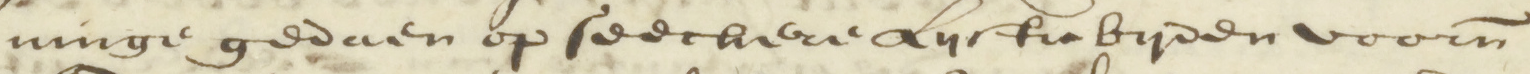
ninge gedaen op seeckere Lyste byden voorn
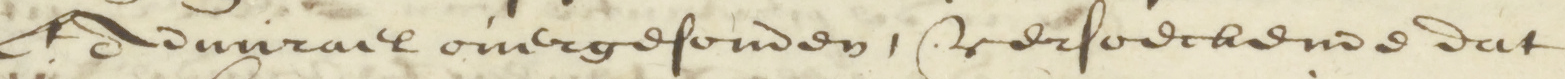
Lt. Admirael overgesonden, versoeckende dat
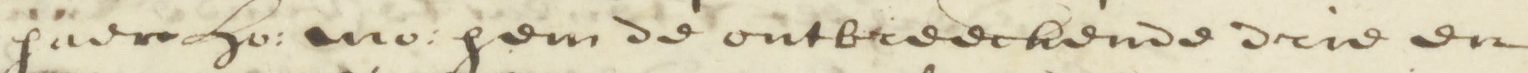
haer Ho:mo: hem de ontbreeckende drie en
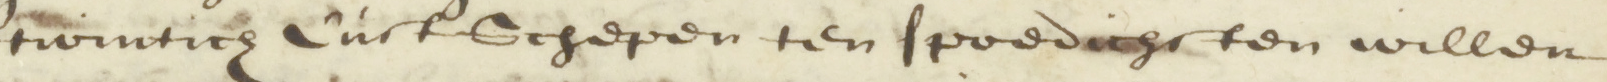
twintich Cust Schepen ten spoedichsten willen
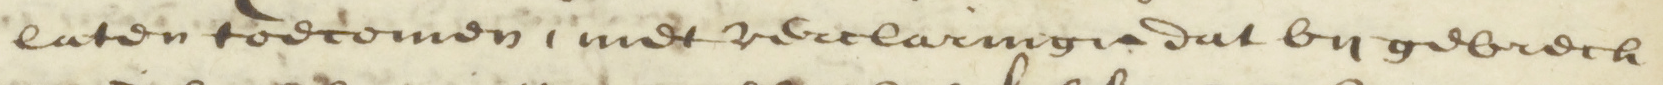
laten toecomen, met verclaringe dat by gebreck
